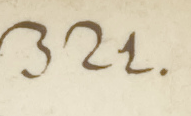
321.
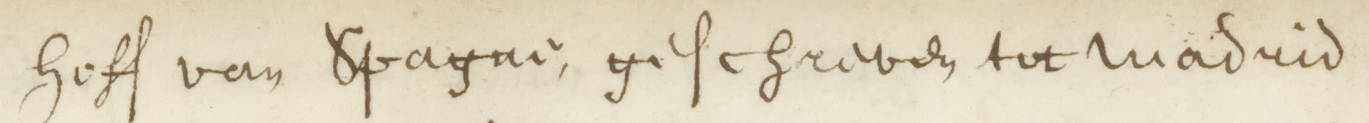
hoff van Spagne, geschreven tot Madrid
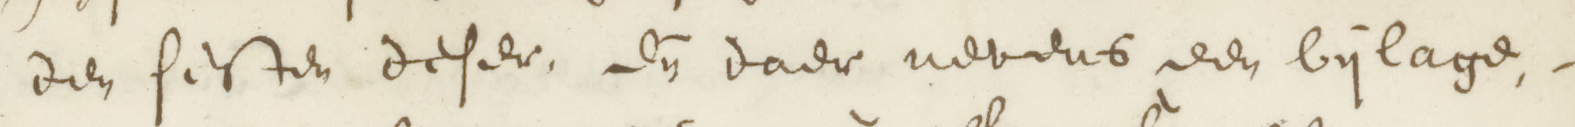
den sesten deser, en daer nevens een bijlage,
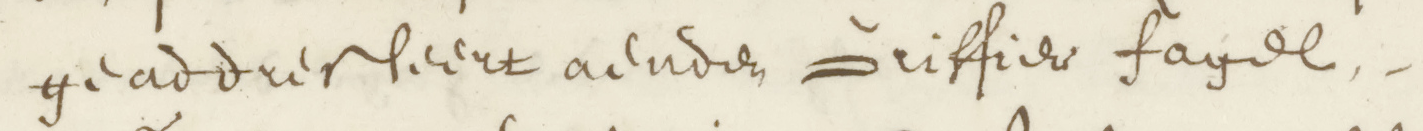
geaddresseert aenden Griffier Fagel,
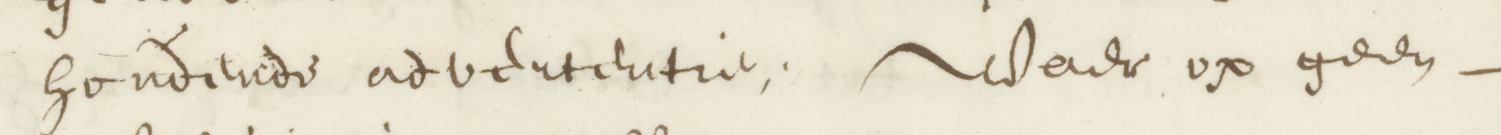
houdende advertentie; Waer op geen
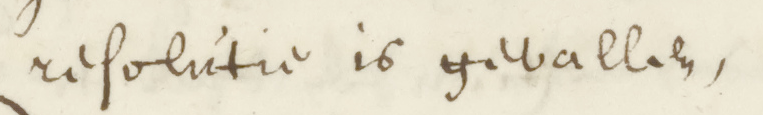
resolutie is gevallen.
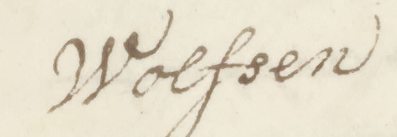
Wolfsen
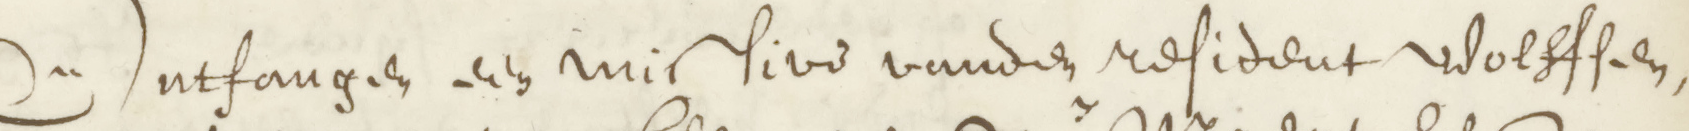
Ontfangen een missive vanden resident Wolffsen,
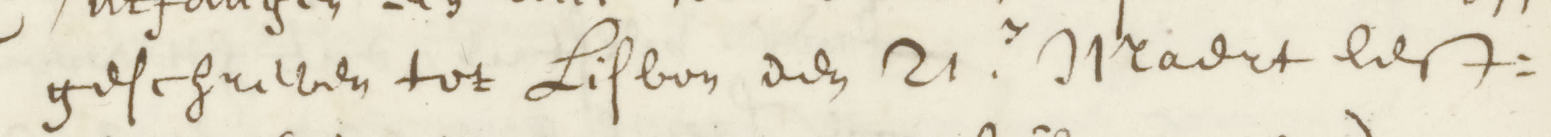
geschreven tot Lisbon den 21e. Maert lest=
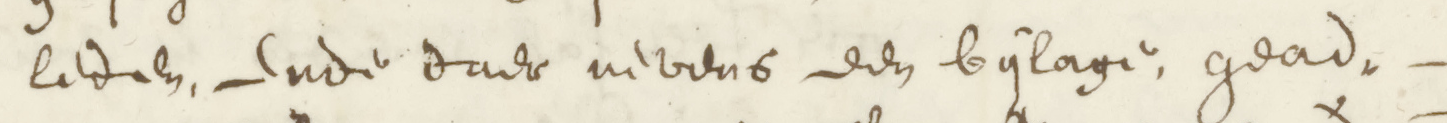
leden, ende daer nevens een bijlage, gead„
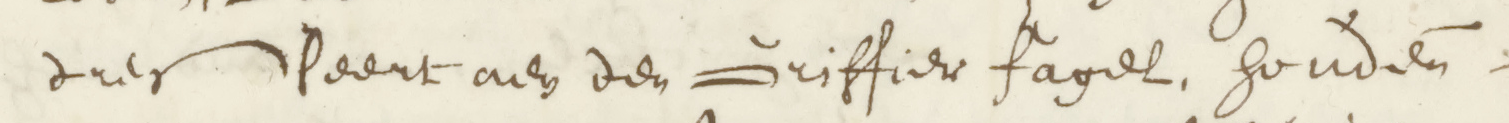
dresseert aen den Griffier Fagel, houden
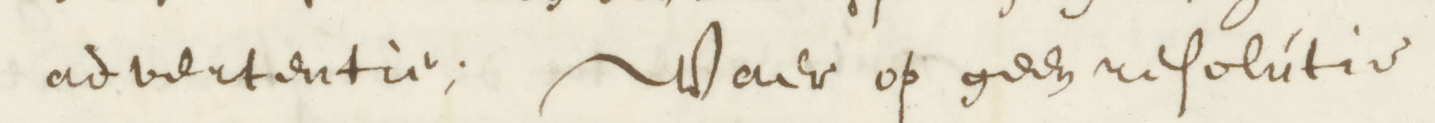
advertentie; Waer op geen resolutie
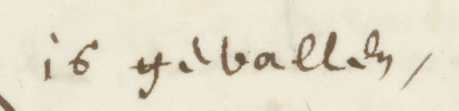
is gevallen.
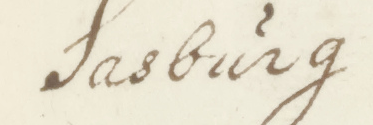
Sasburg
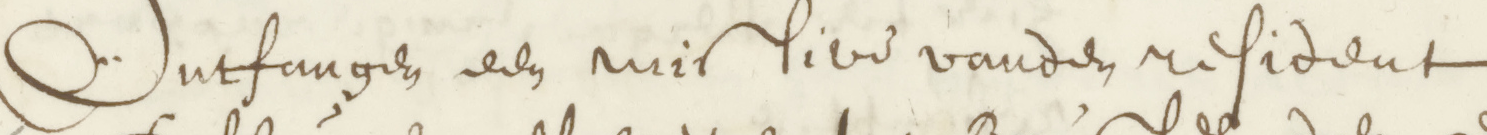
Ontfangen een missive vanden resident
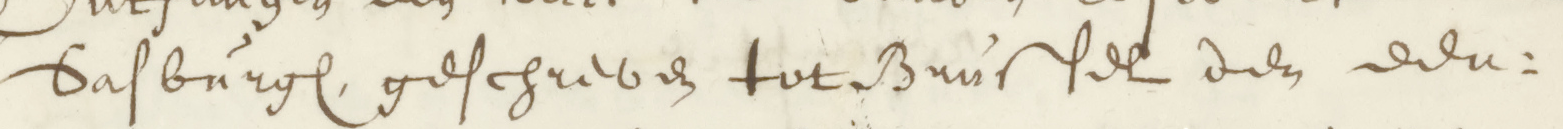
Sasburgh, geschreven tot Brussel den een=
